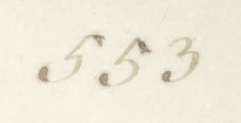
553
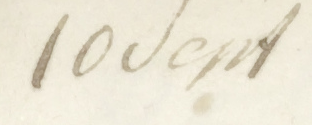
10 Sept
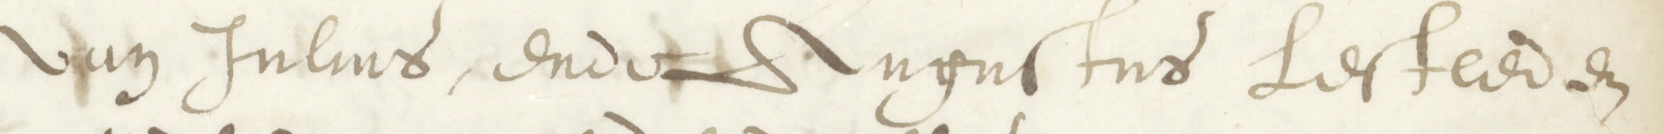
van Julius, ende Augustus Lestleden
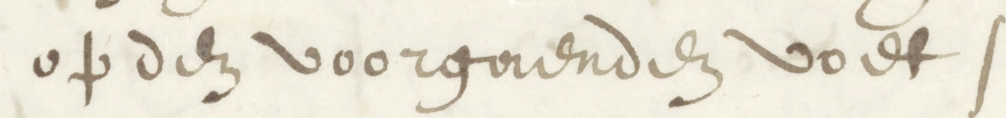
op den voorgaenden voet.
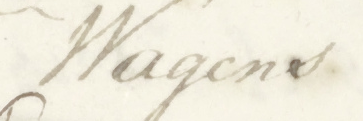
Wagens
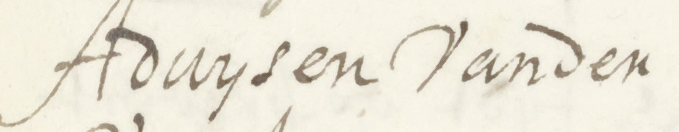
Aduysen Vanden
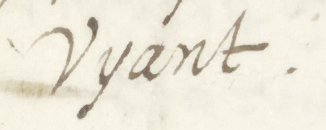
Vyant.
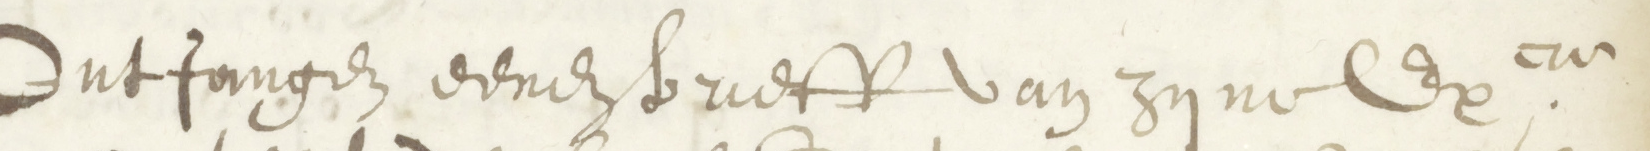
Ontfangen eenen brieff van zyne Excie.
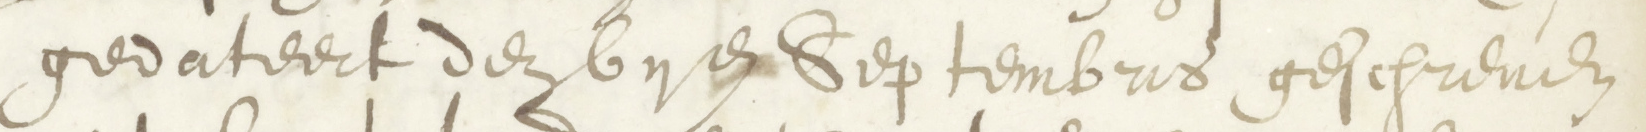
gedateert den vije Septembris geschreuen
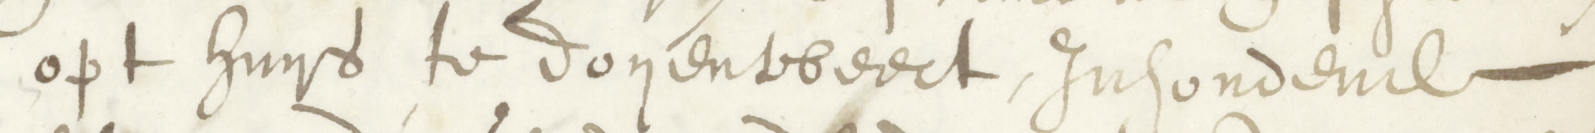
opt huys te Doyenweert, Inhoudende
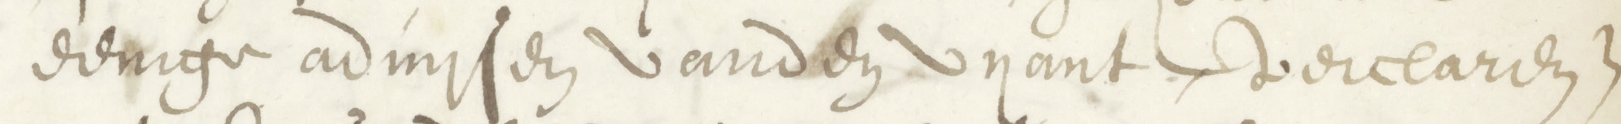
eenige aduysen vanden vyant verclaren
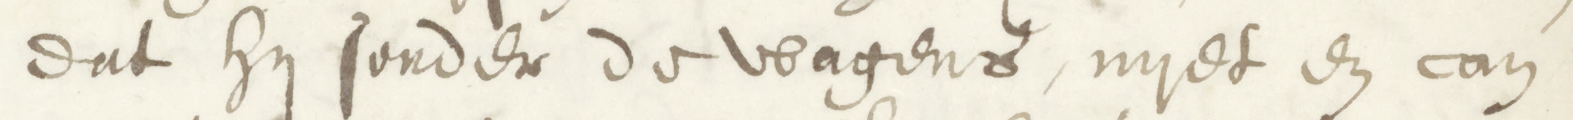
dat hy sonder de wagens, nyet en can
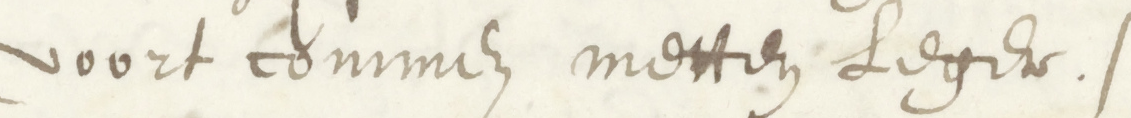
voort commen metten Leger.
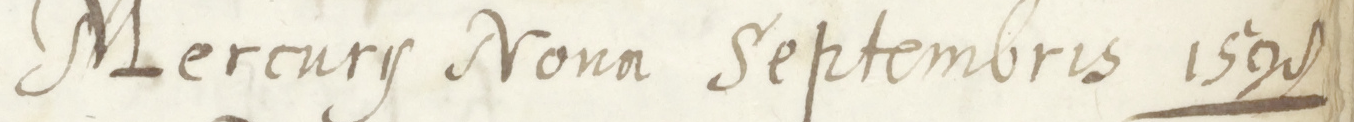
Mercury Nona Septembris 1598
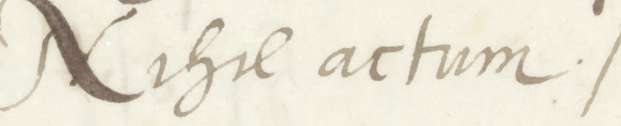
Nihil actum.
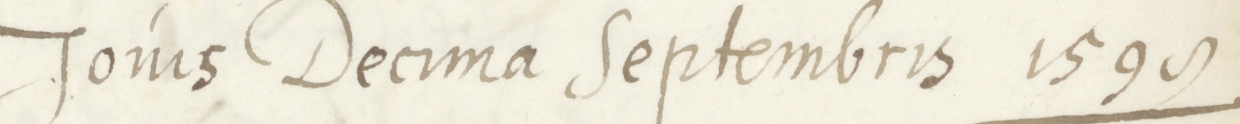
Jouis Decima Septembris 1598
